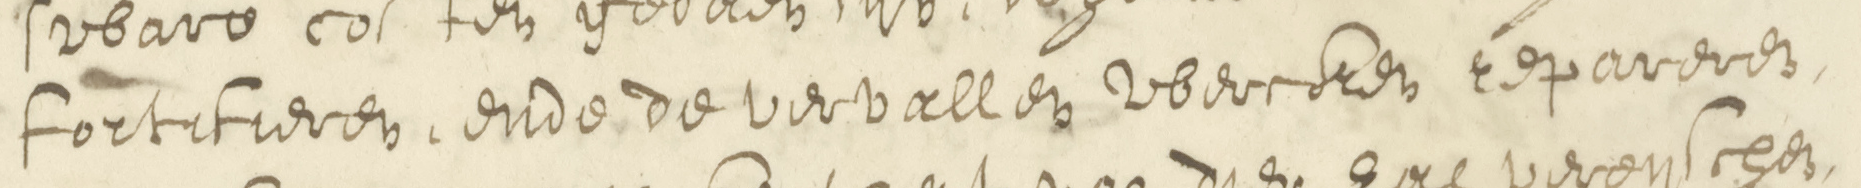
fortifieren, ende de vervallen wercken repareren,
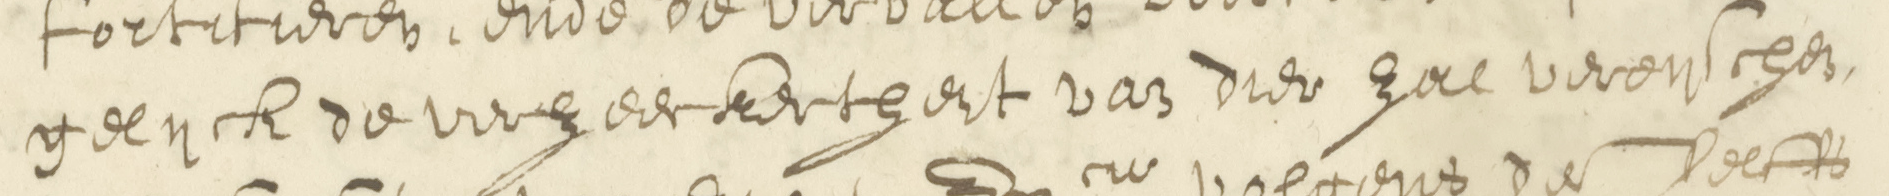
gelyck de verzeeckertheyt van dier zal vereyschen,
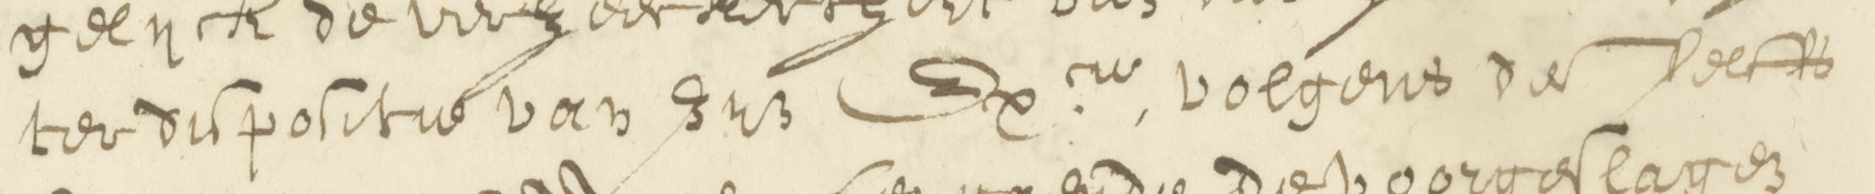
ter dispositie van zyn Excie. volgens desselffs
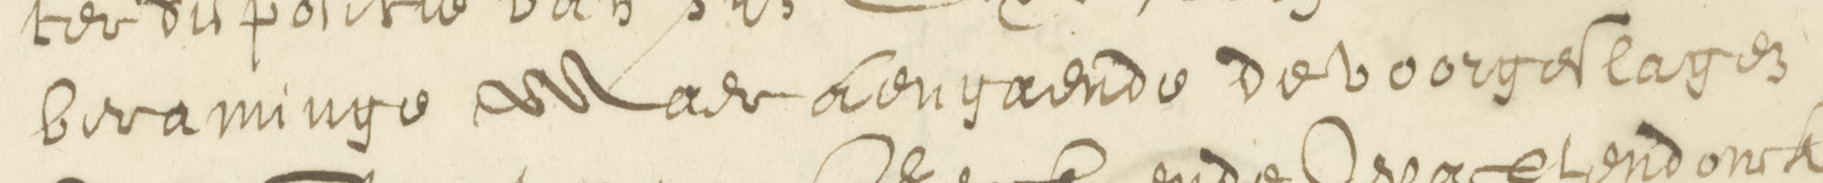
beraminge. Maer aengaende de voorgeslagen
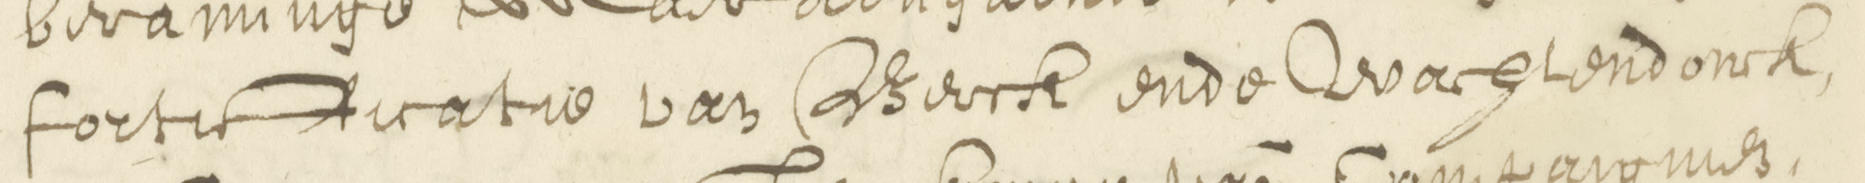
fortifficatie van Berck ende Wachtendonck,
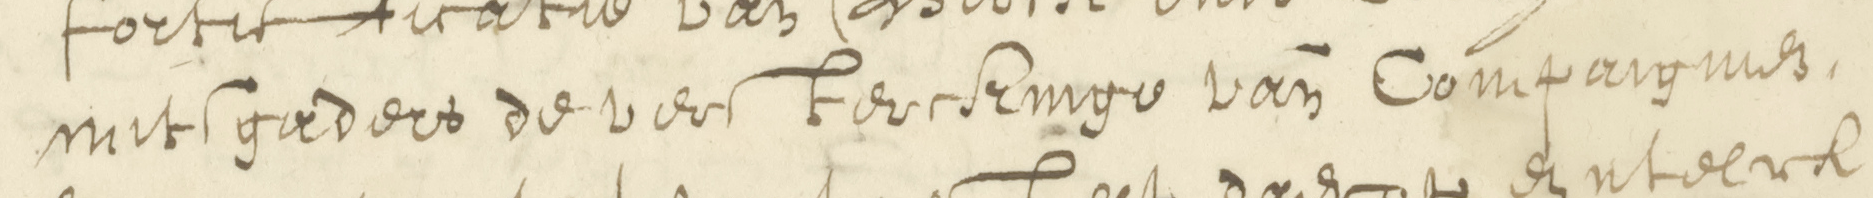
mitsgaders de versterckinge van Compaignien,
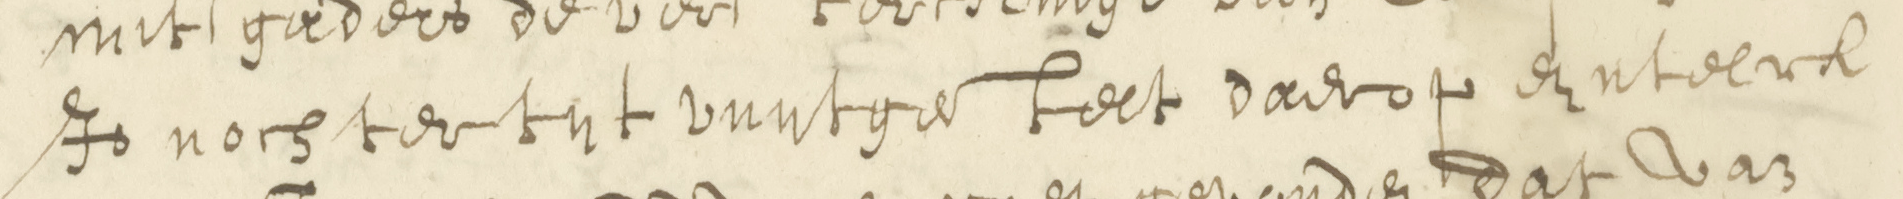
Is noch ter tyt vuytgestelt daerop eyntelick
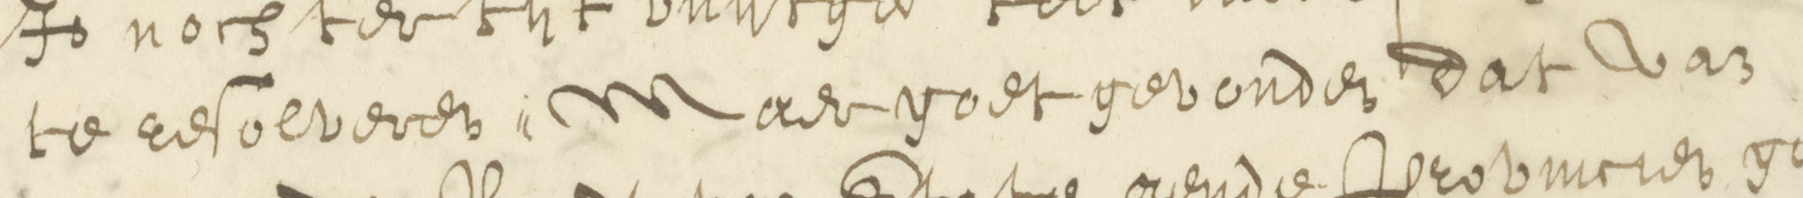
te resolveren, Maer goetgevonden dat van
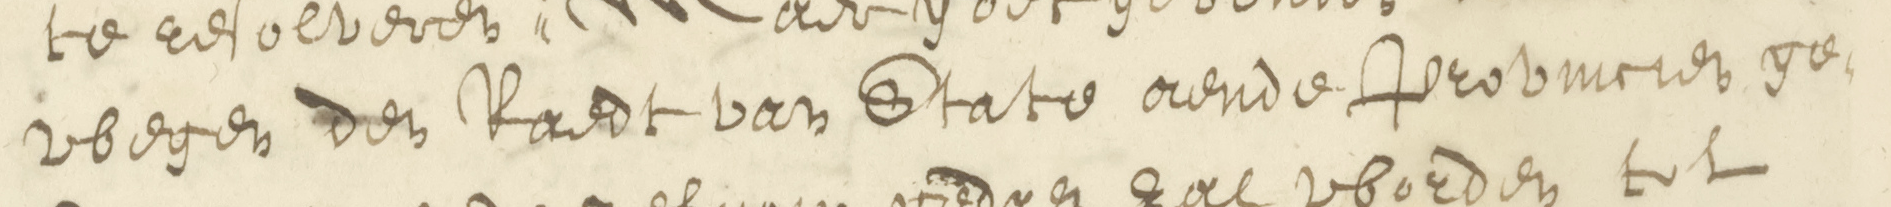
wegen den Raedt van State aende Provincien ge„
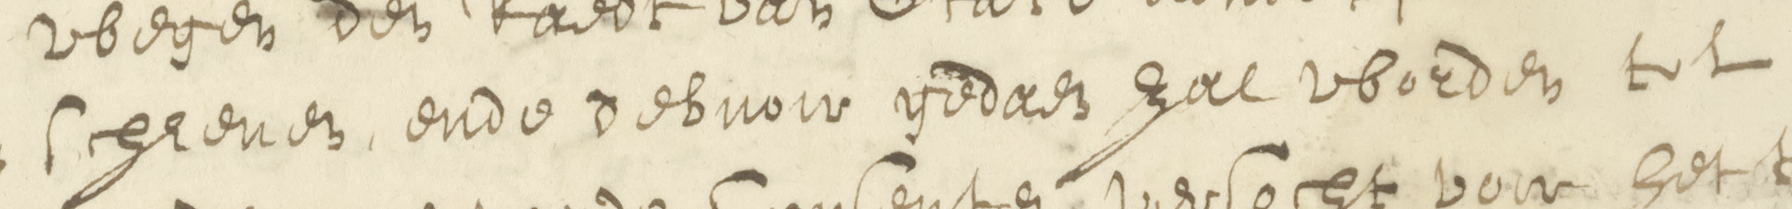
„schreven, ende debuoir gedaen zal worden tot
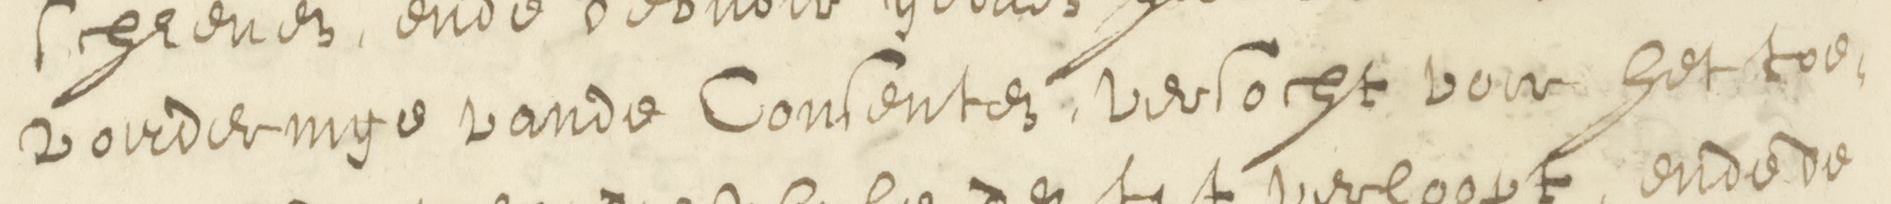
voirderinge vande Consenten, versocht voir het toe„
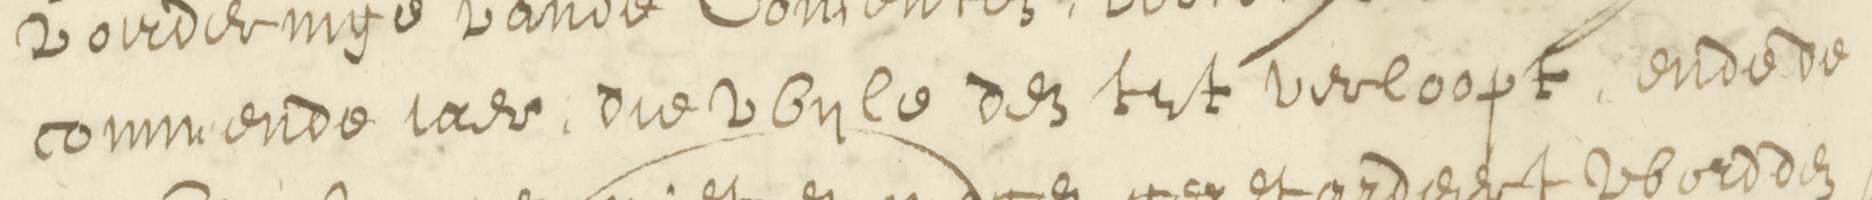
commende iaer, die wyle den tyt verloopt, ende de
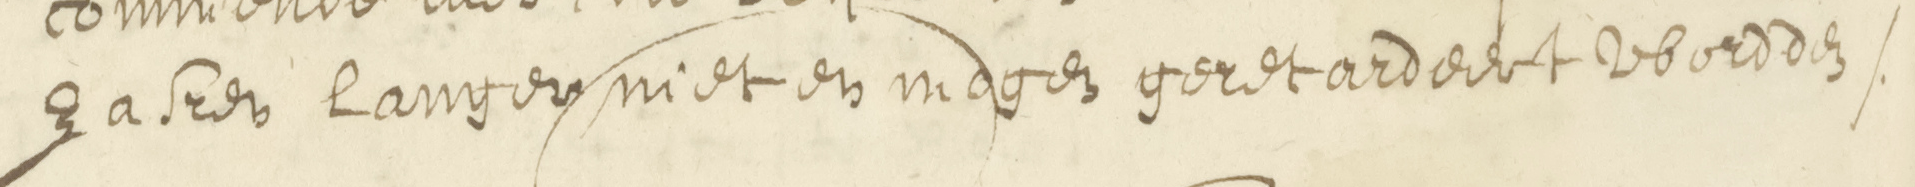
zaken langer niet en mogen geretardeert wordden.
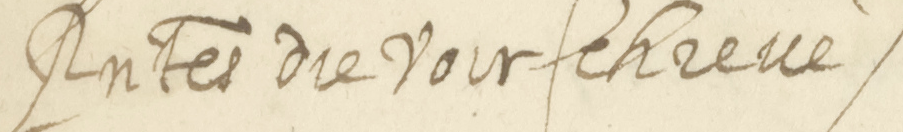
Pntes die voirschreue.
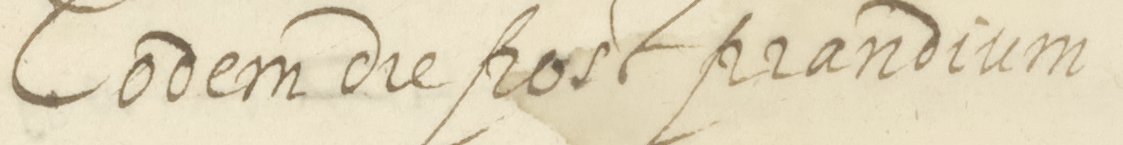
Eodem die post prandium
